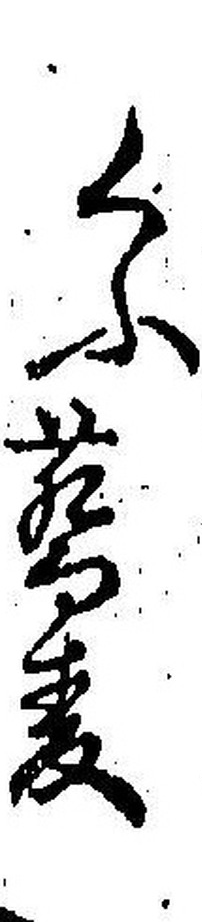くふ蕎麦
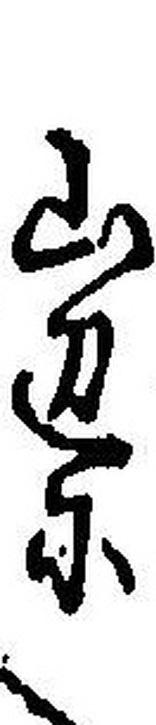山辺に
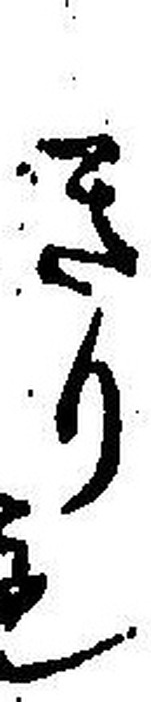きりも
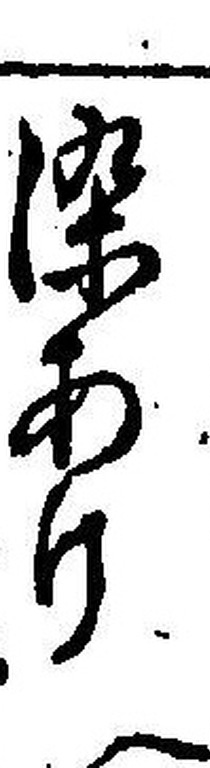染あけ
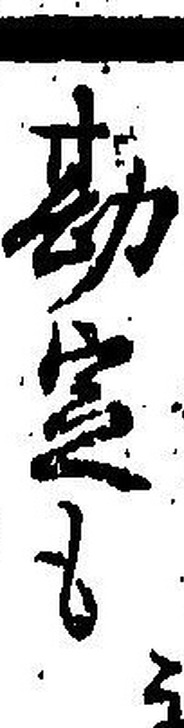勘定も
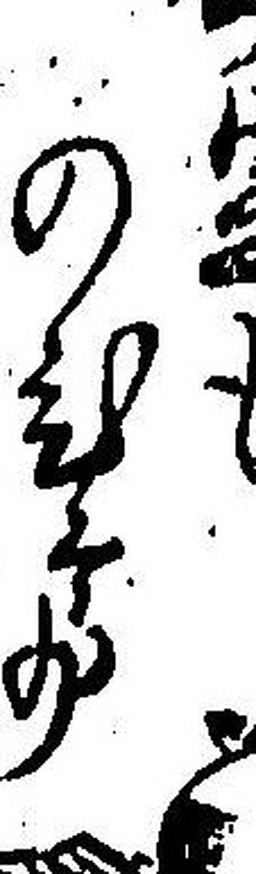のひて
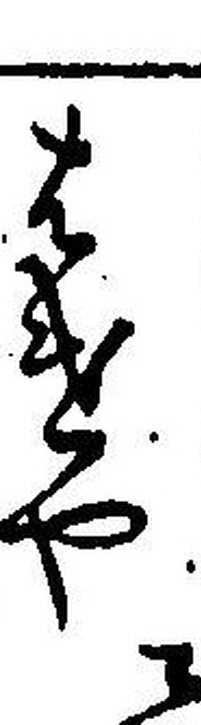はけや
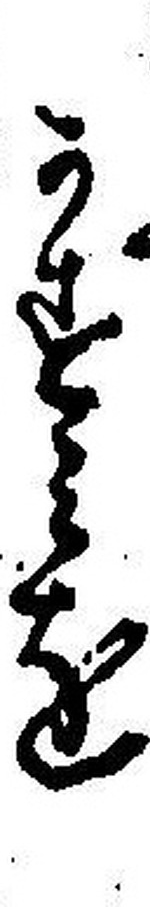かすみを
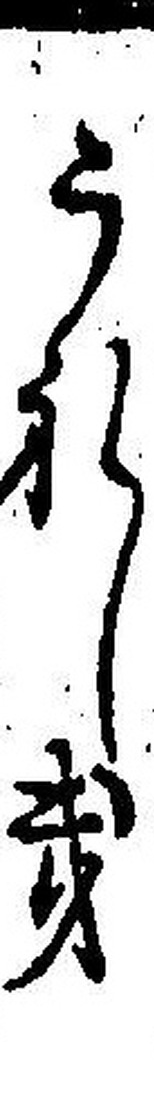うれしき
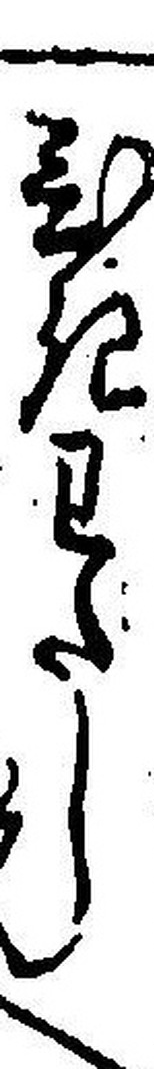ひきわたし
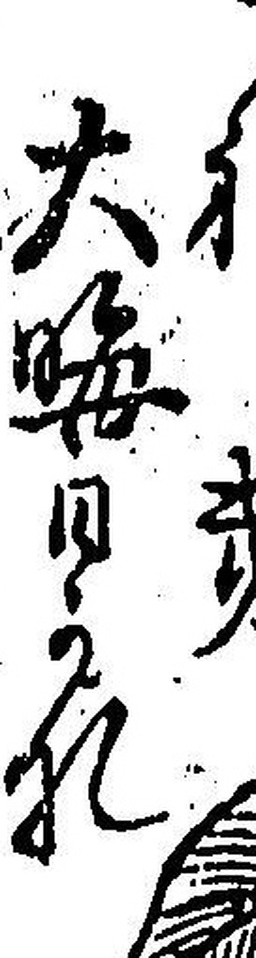大晦日かな
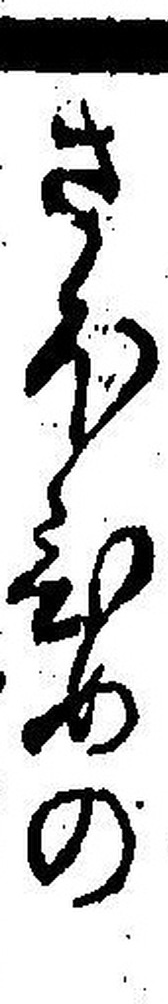さほひめの
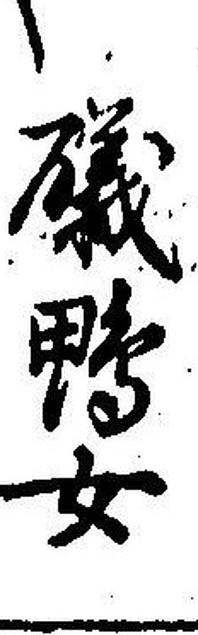磯鴨女
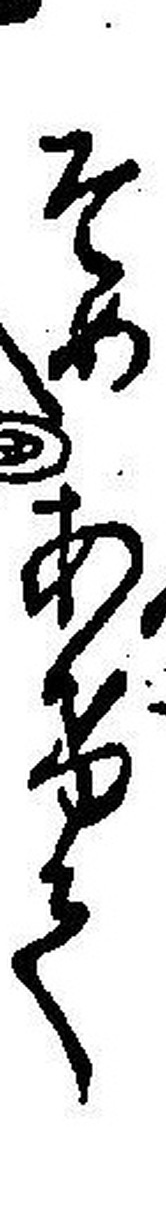そめあけて
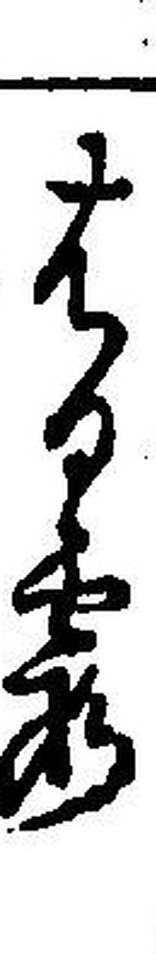はる霞
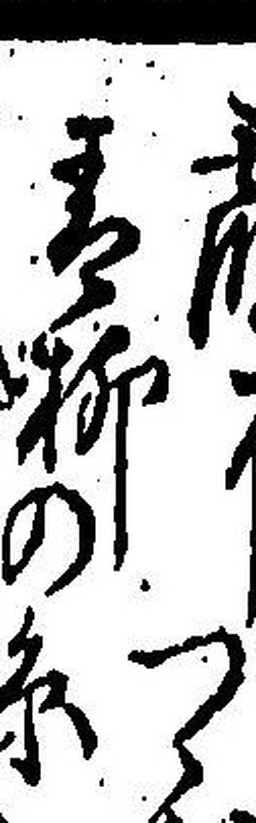青柳の糸
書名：どうれ百人一首 / 鹿都部真顔(狂歌堂)編
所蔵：東京大学総合図書館 General Library in the University of Tokyo, JAPAN
